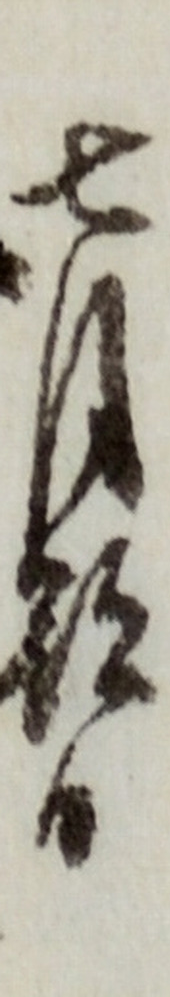七月朔日
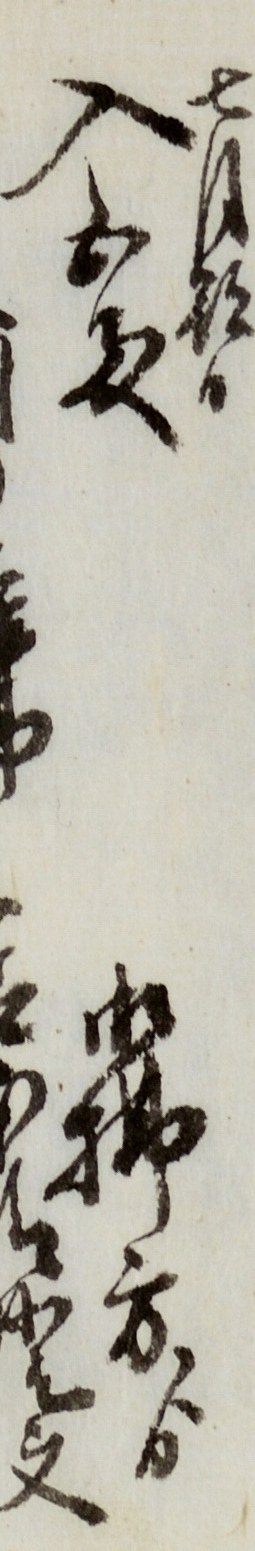入五両御払方ゟ
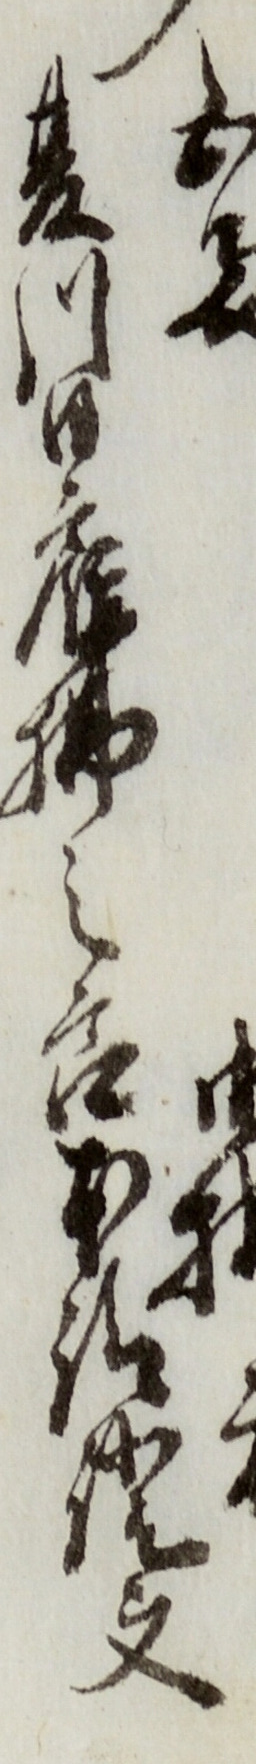夏川日雇払之本請證文
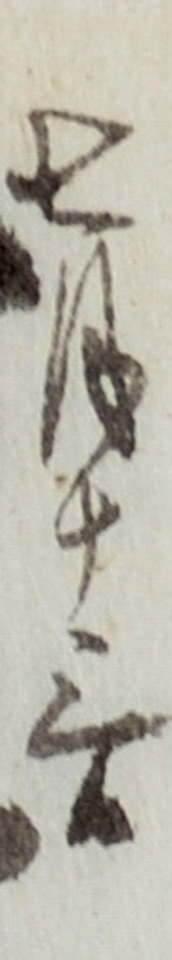七月十三日
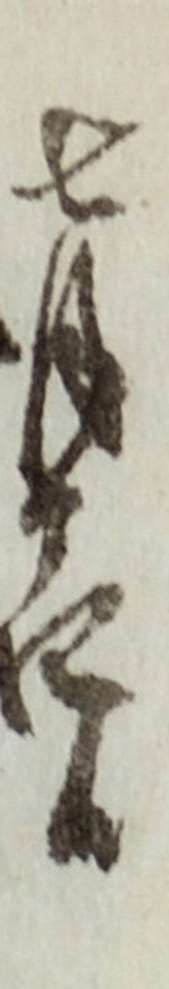七月十四日
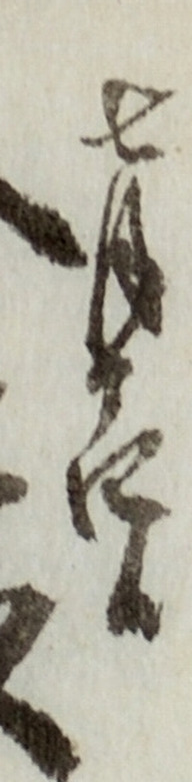七月十四日
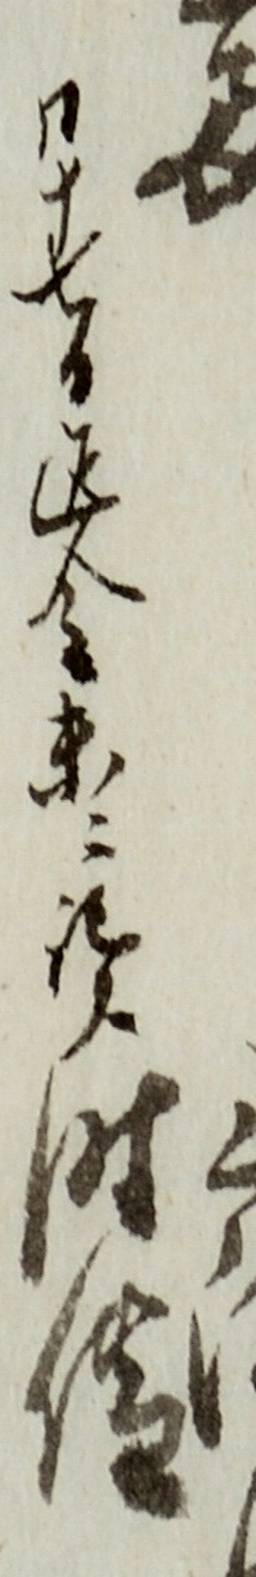同十七日送金末二記ス時借
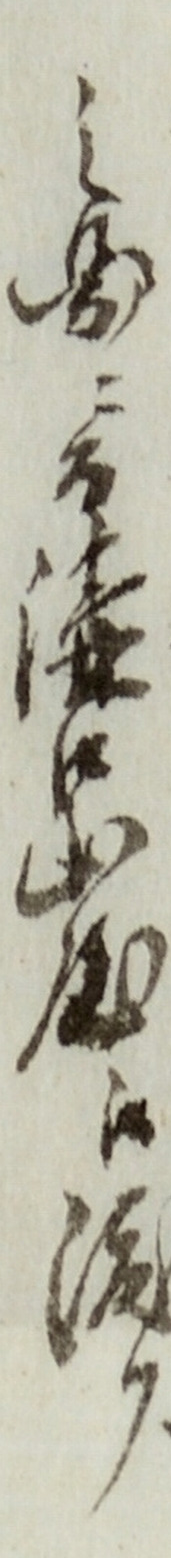之図ニ而済口山屋江渡ㇲ

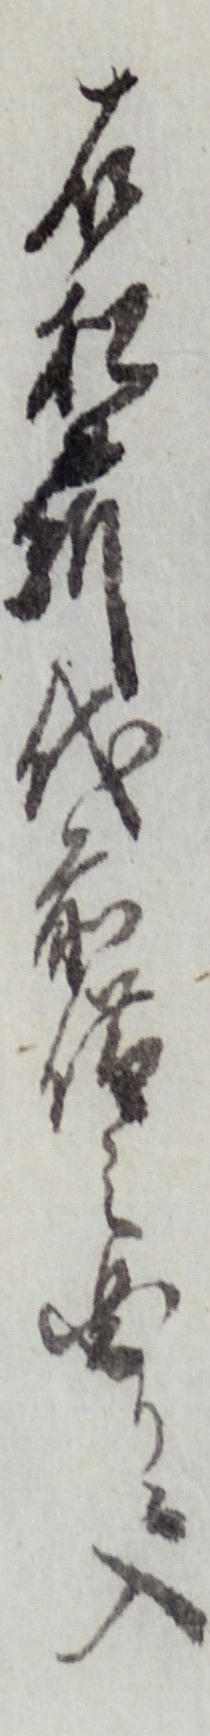右松薪伐前借之図り江入
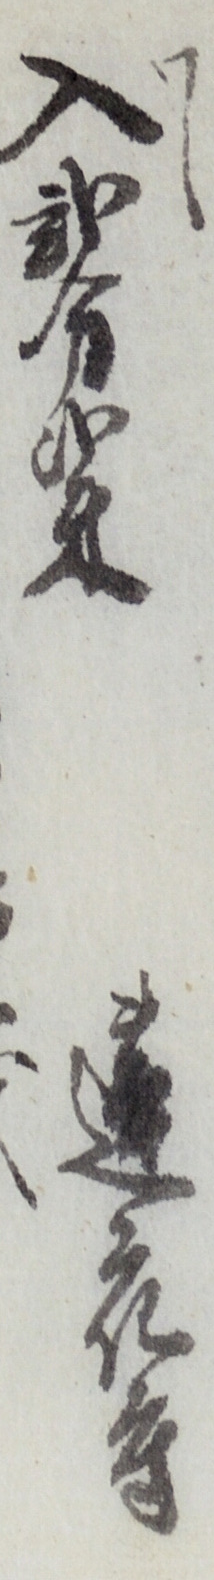入弐分弐朱蓮花寺
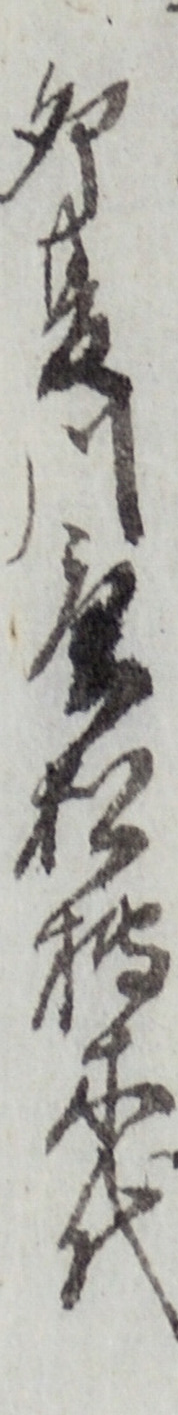卯夏川唐松榑木代
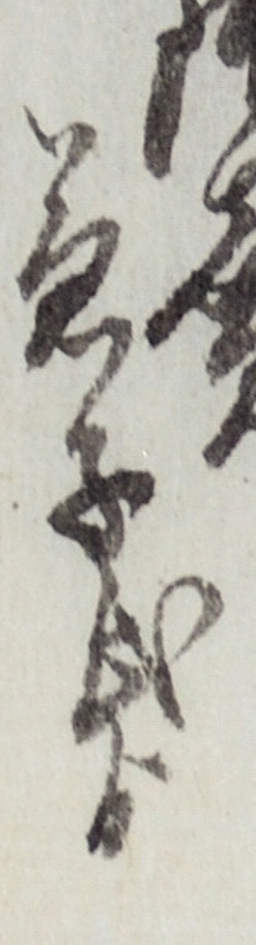兼子氏ゟ
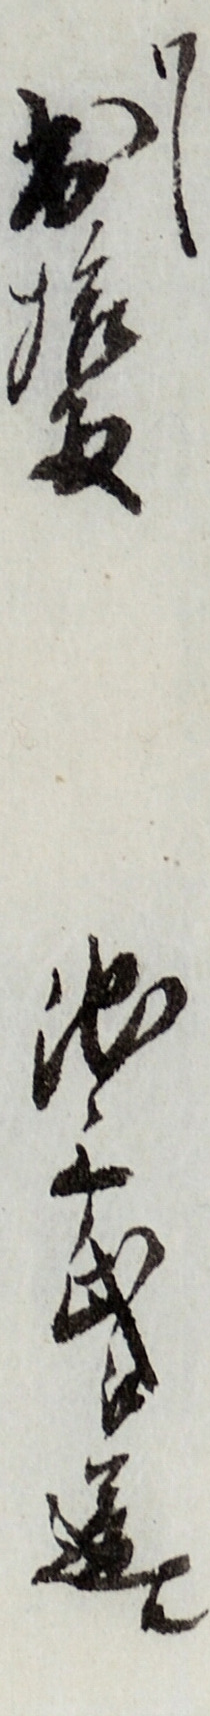出拾両池上氏江送ル
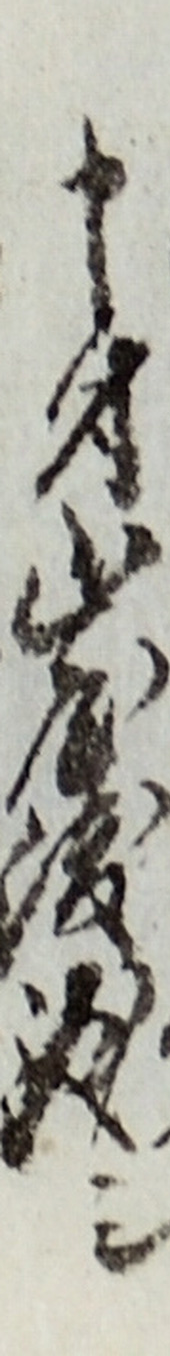申付山屋渡致シ
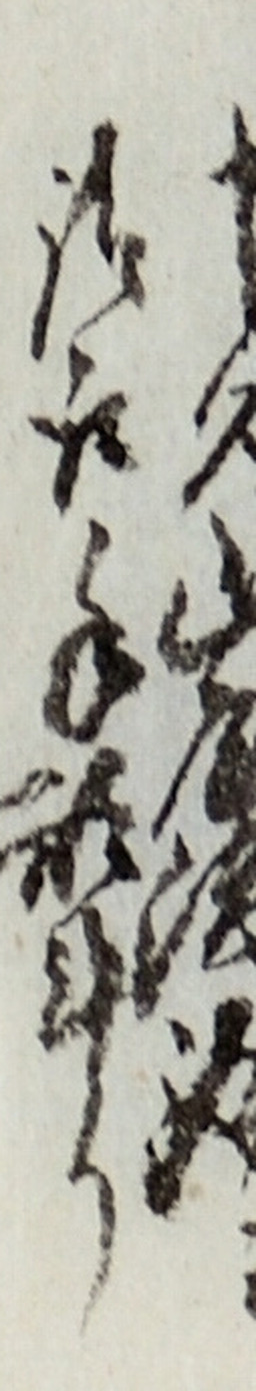請取手形斗り
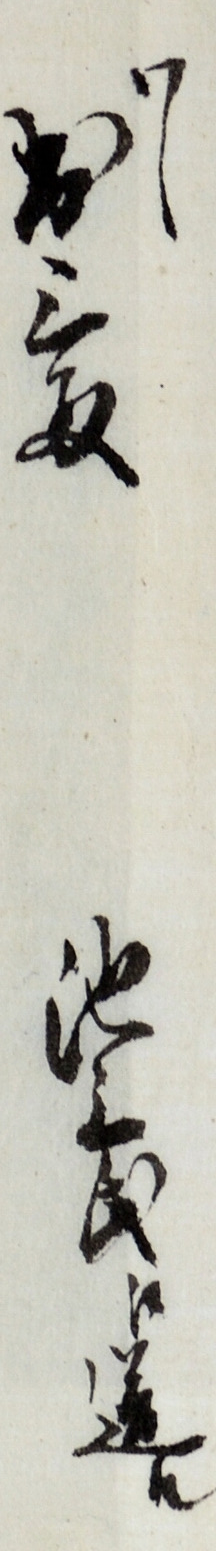出三両池上氏江送ル
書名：中沢郷御竹薮見廻り
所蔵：伊那市立高遠町図書館・合同会社AMANE
